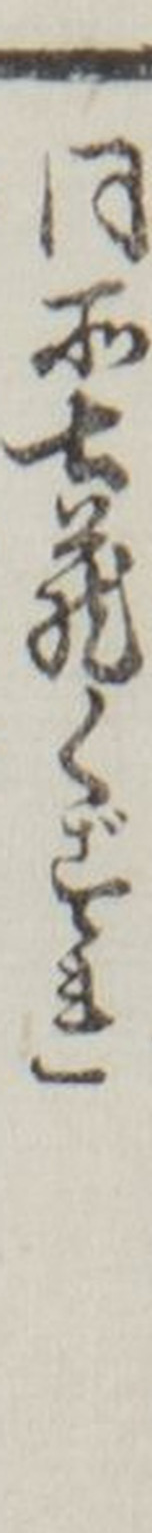同所土蔵くずれ
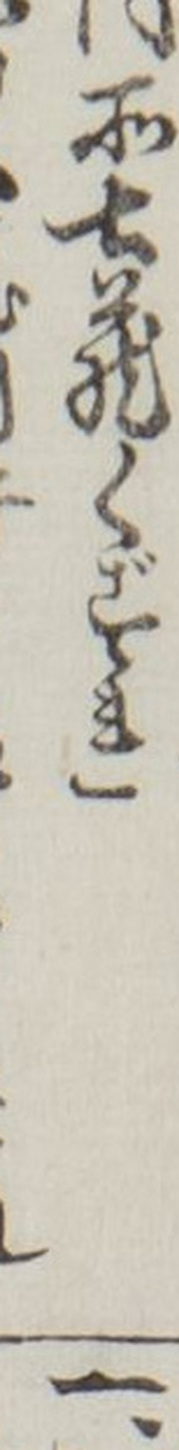同所土蔵くずれ
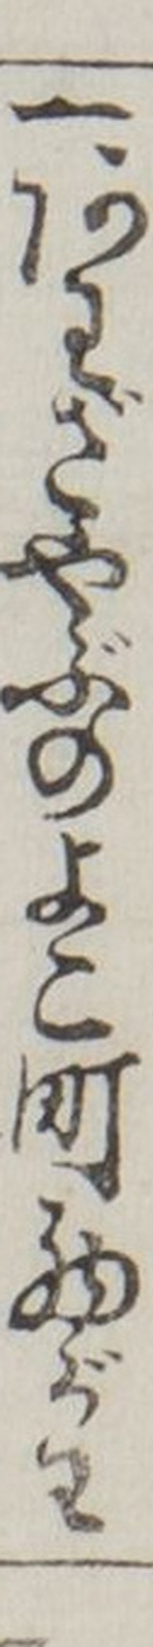一あわざやぶのよこ町西がわ
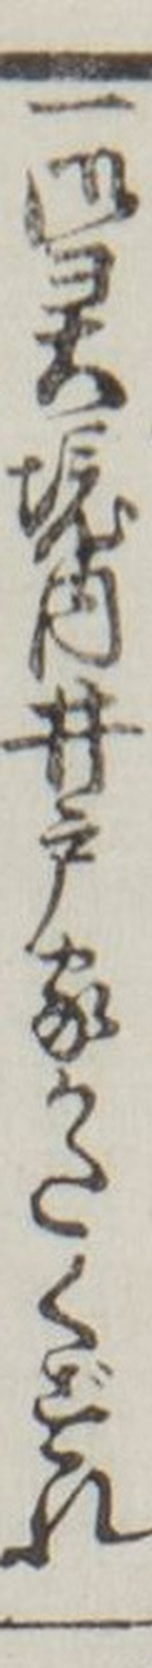一御霊境内井戸家かたくずれ
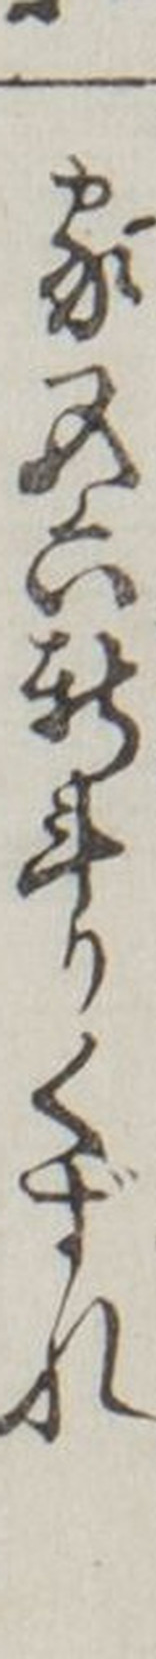家五六軒斗りくずれ
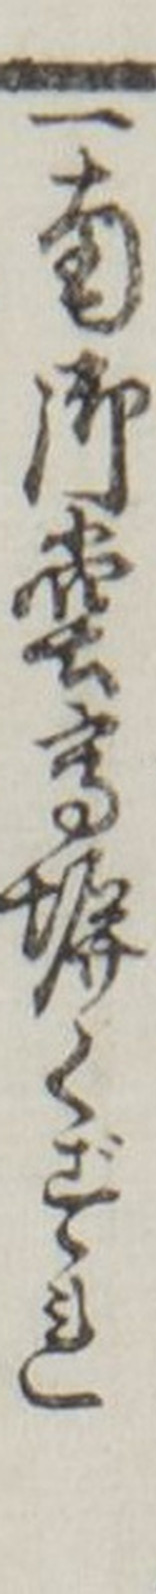一南御堂高塀くずれ
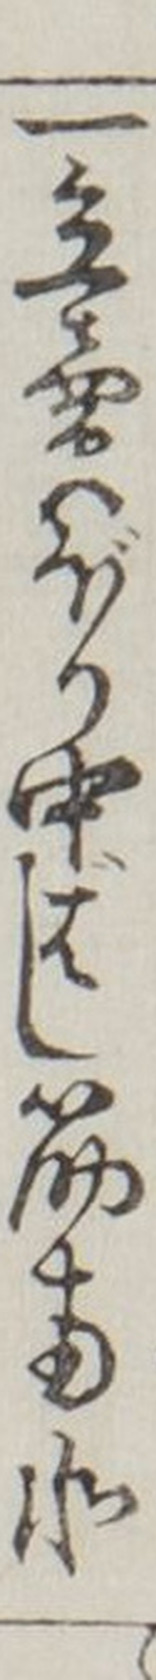一立売ぼり中ばし筋南北
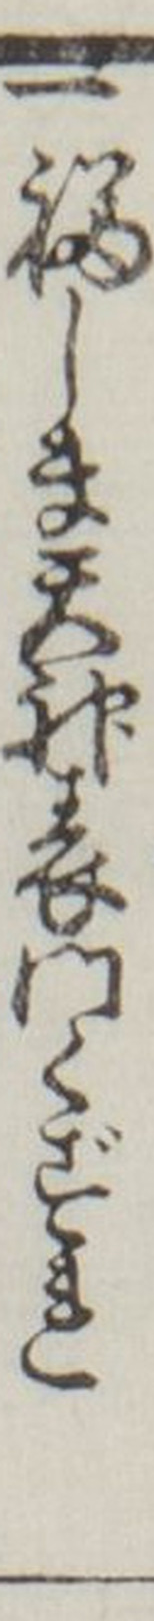一福しま天神表門くずれ
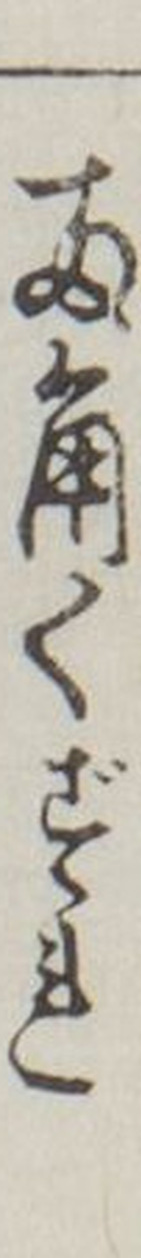両角くずれ
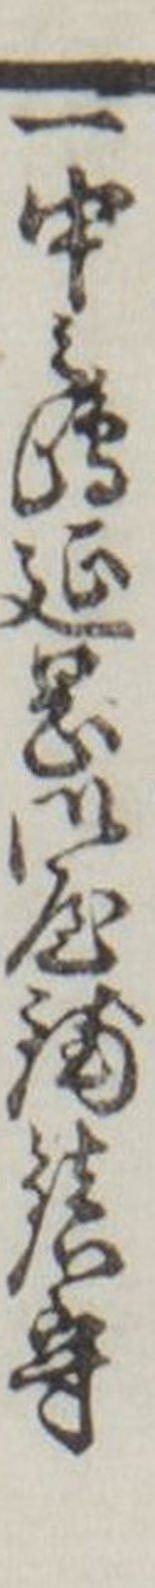一中之嶋延岡御屋鋪鎮守
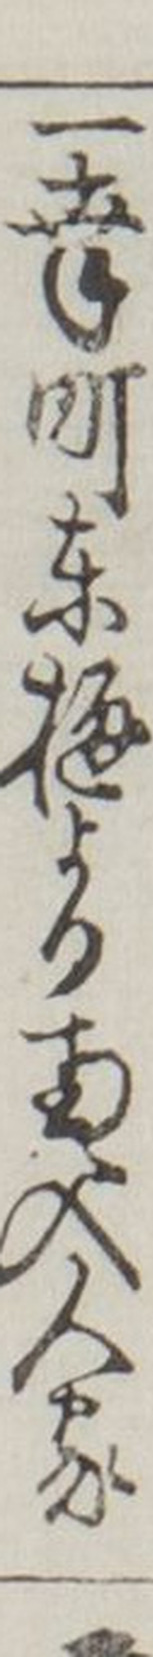一幸町東通より南に入人家
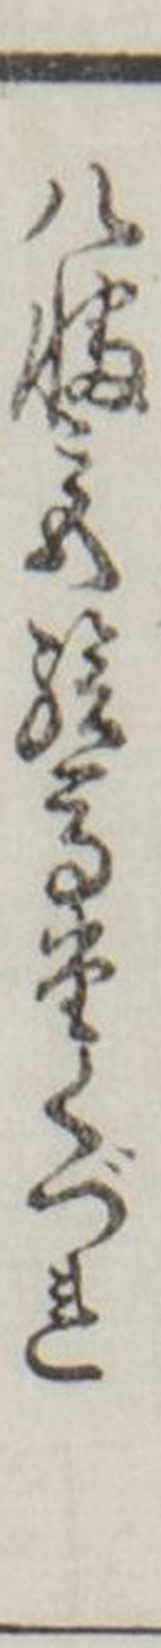八幡宮絵馬堂くづれ
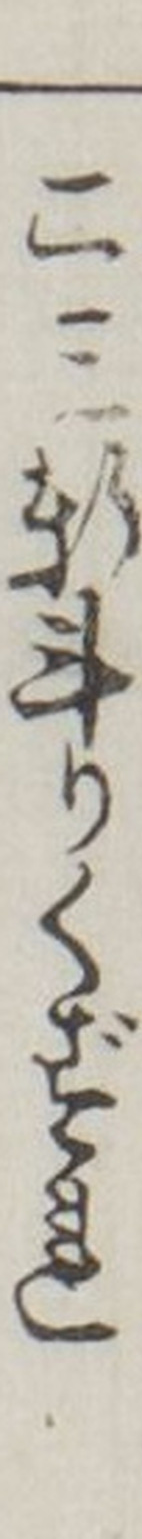二三軒斗りくずれ
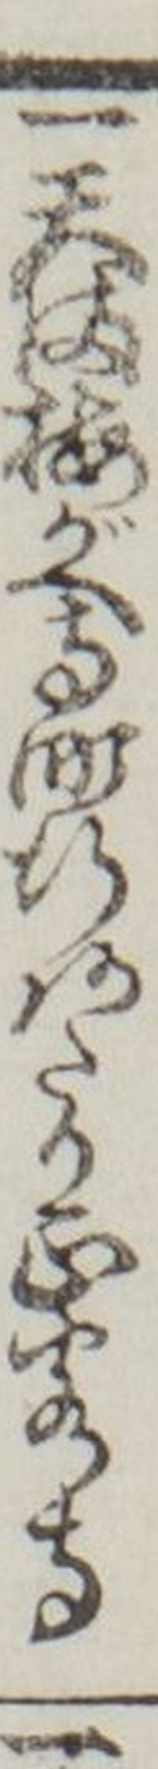一天満梅がへ寺町行あたり正客寺
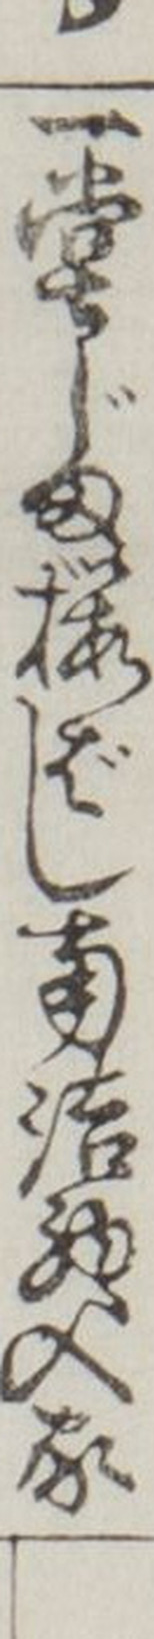一堂じま桜ばし南詰西に入家
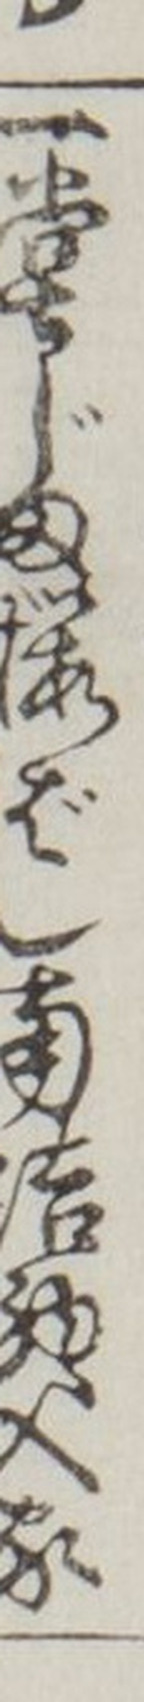一堂じま桜ばし南詰西に入家
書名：本志らべ大阪大地震大破略記
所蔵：あいおいニッセイ同和損保株式会社
